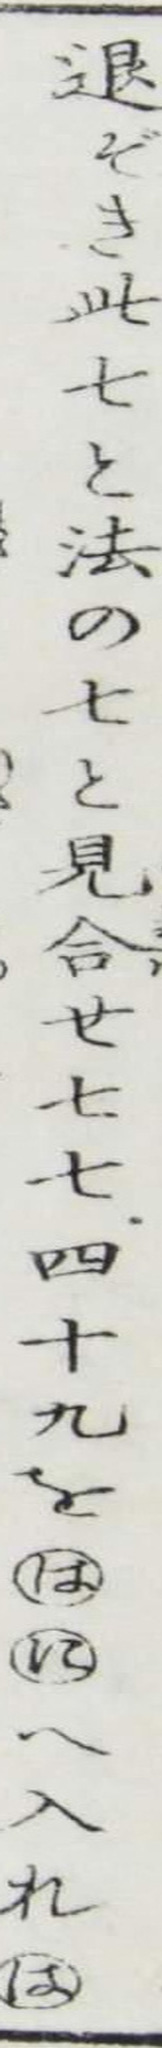退ぞき此七と法の七と見合せ七七．四十九を㋩㋥へ入れ㋩
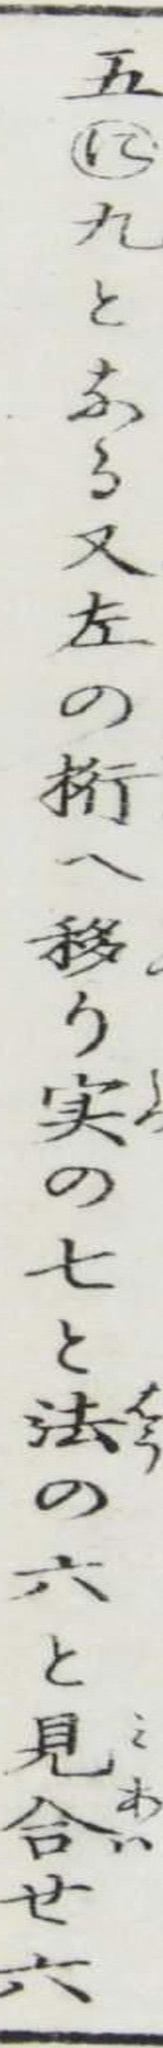五㋥九となる又左の桁へ移り実の七と法の六と見合せ六
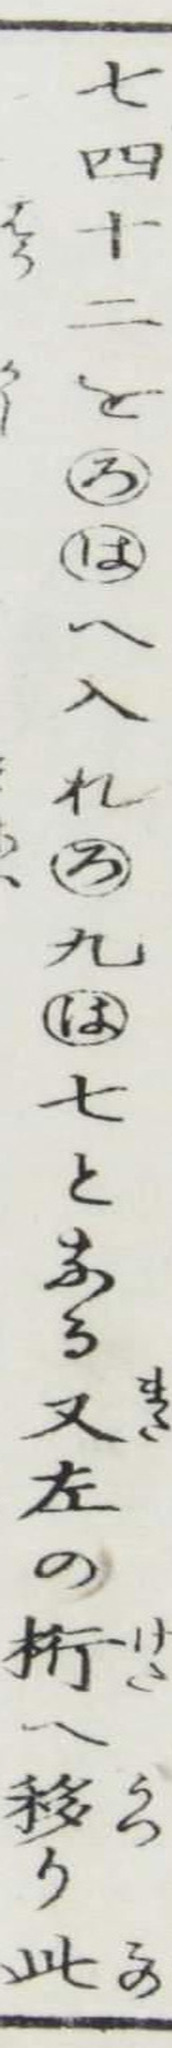七．四十二を㋺㋩へ入れ㋺九㋩七となる又左の桁へ移り此
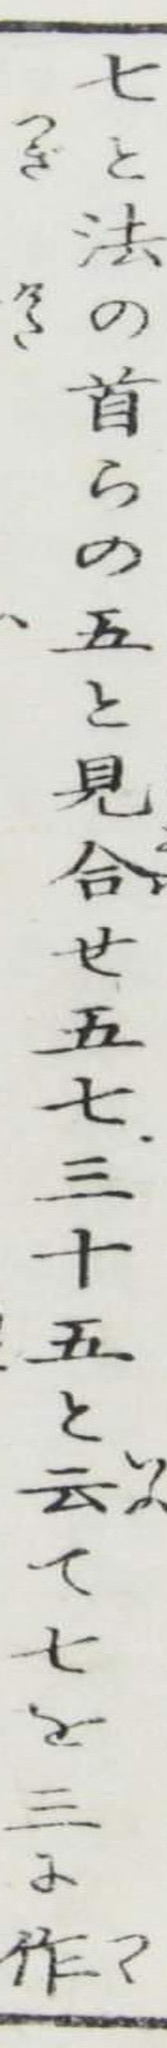七と法の首らの五と見合せ五七．三十五と云て七を三に作
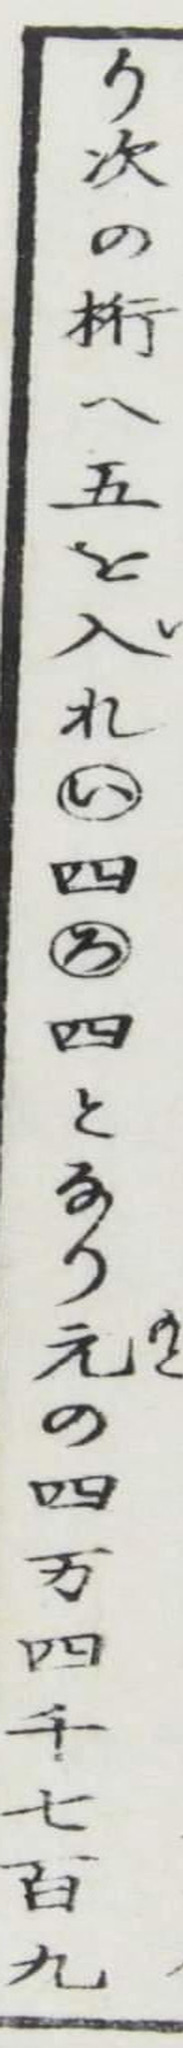り次の桁へ五を入れ㋑四㋺四となり元の四万四千七百九
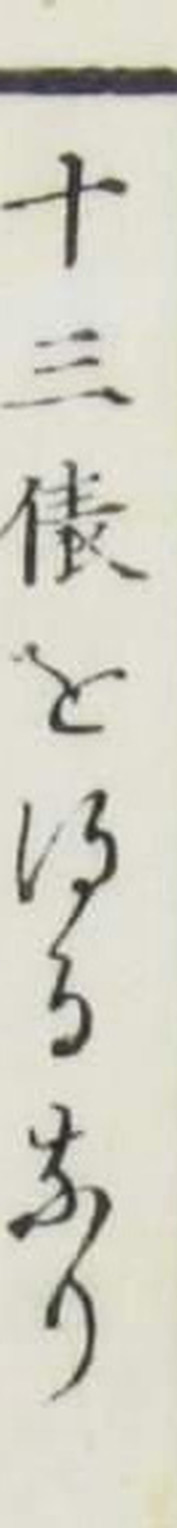十三俵を得るなり
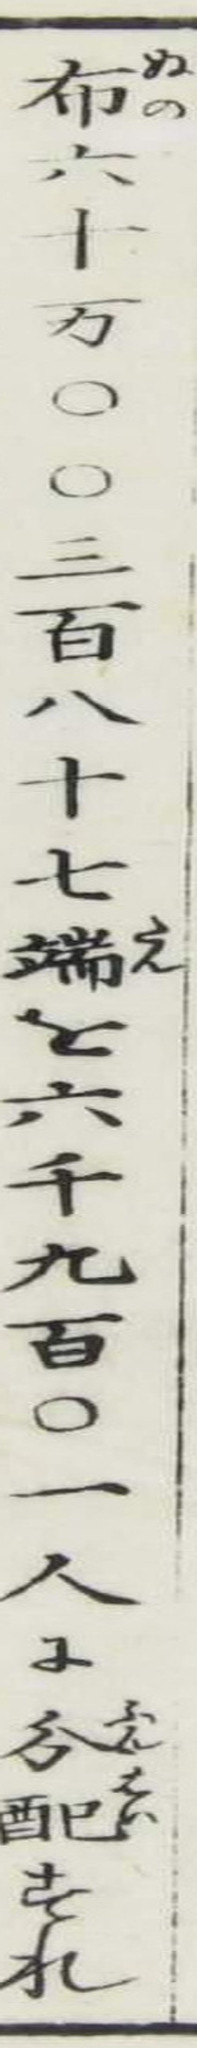布六十万〇〇三百八十七端を六千九百〇一人に分配すれ
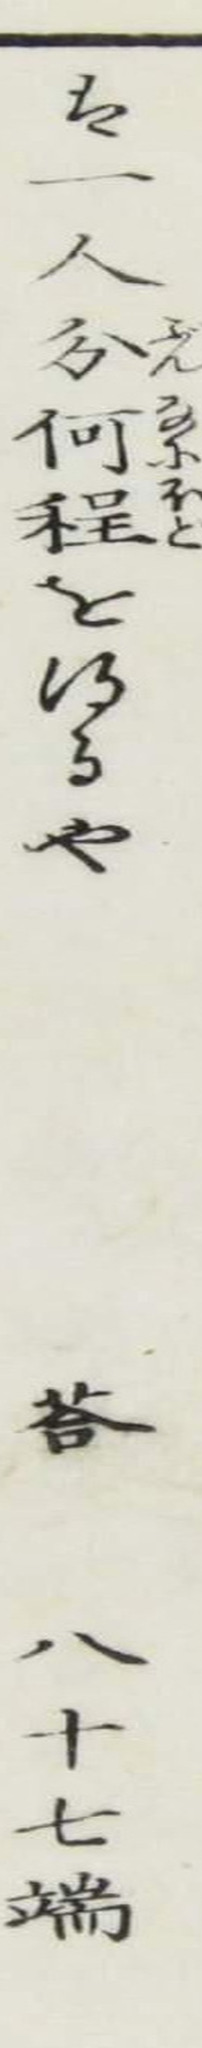は一人分何程を得るや答八十七端
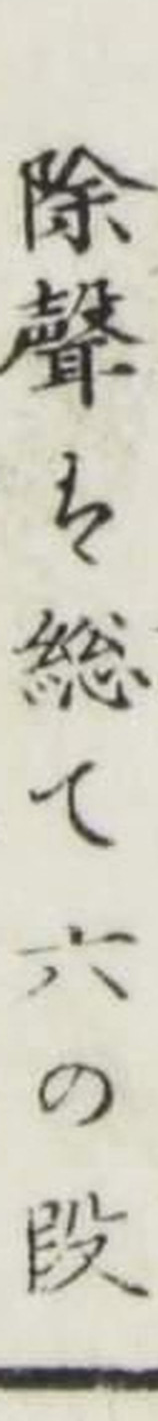除声は総て六の段
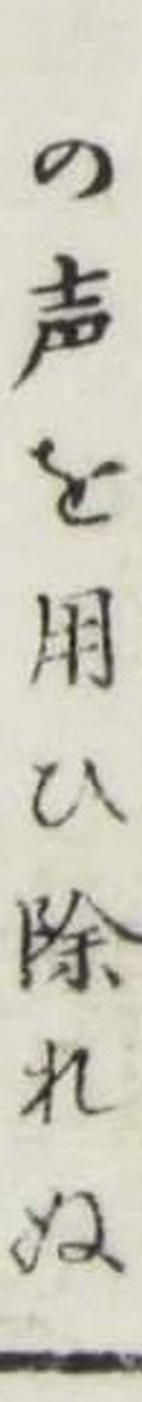の声を用ひ除れぬ
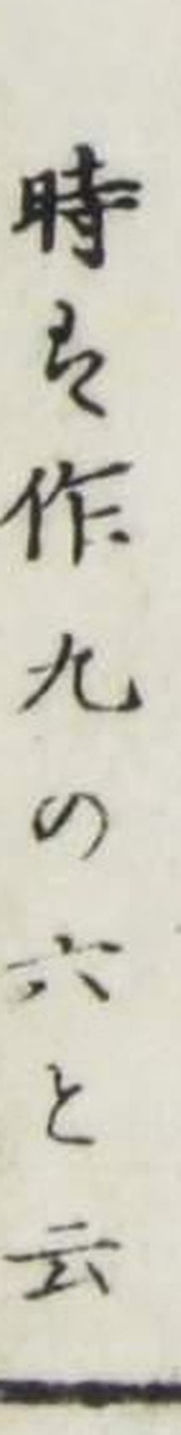時は作九の六と云
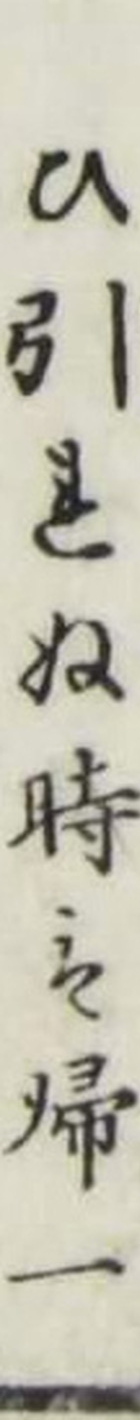ひ引れぬ時は帰一
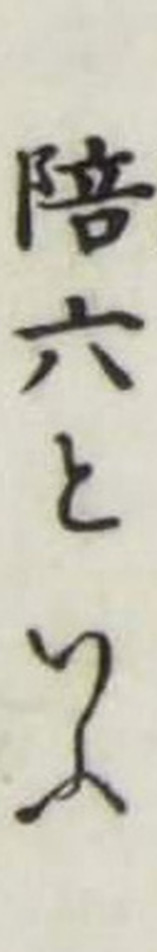陪六といふ
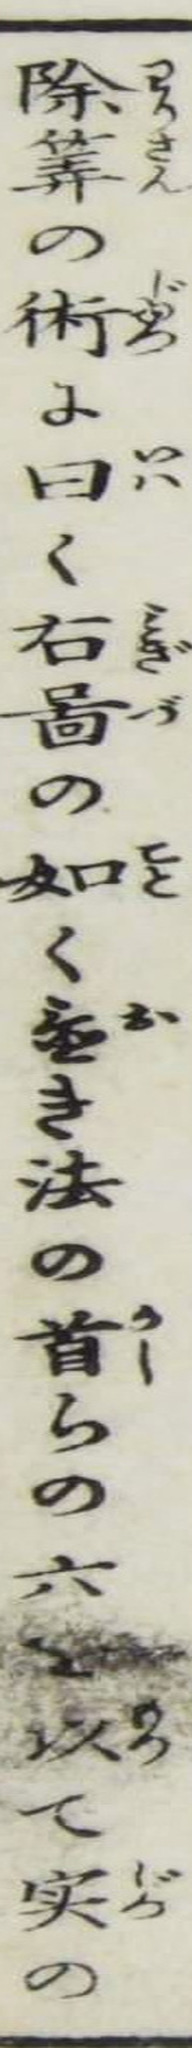除算の術に曰く右図の如く置き法の首らの六を以て実の

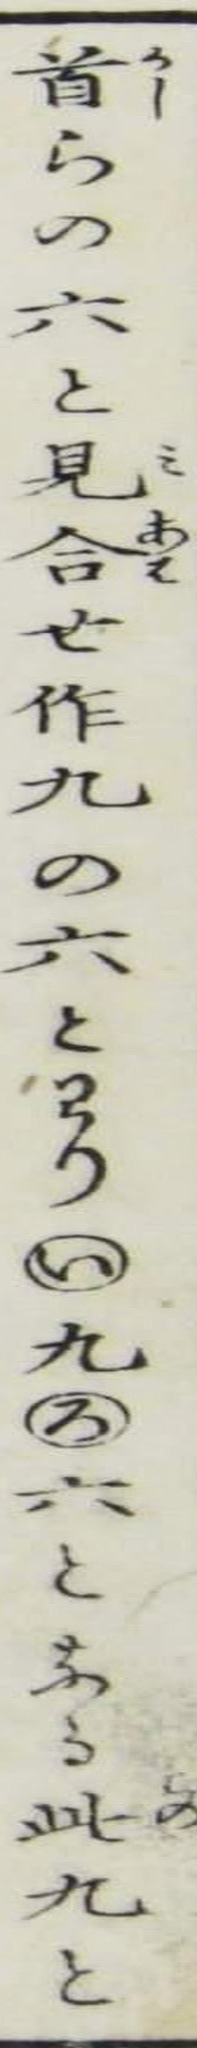首らの六と見合せ作九の六とわり㋑九㋺六となる此九と
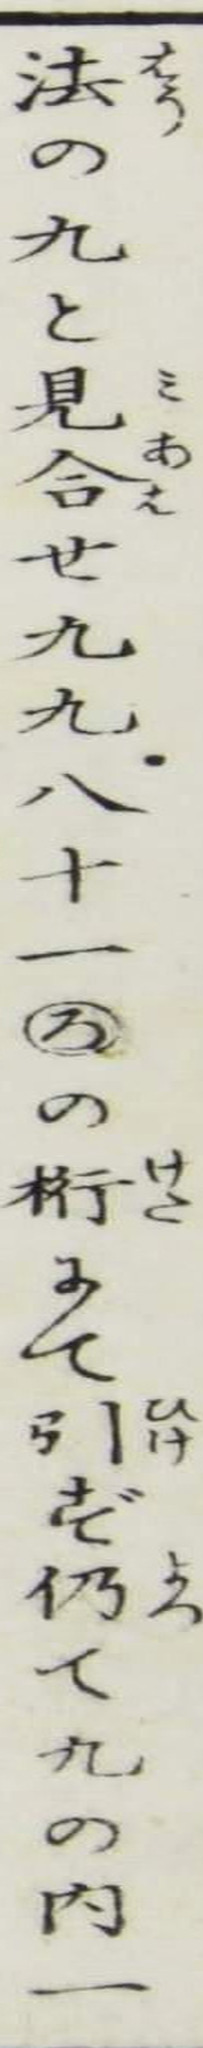法の九と見合せ九九．八十一㋺の桁にて引ず仍て九の内一
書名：明治小學塵劫記 卷1
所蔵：東京学芸大学教育コンテンツアーカイブ
